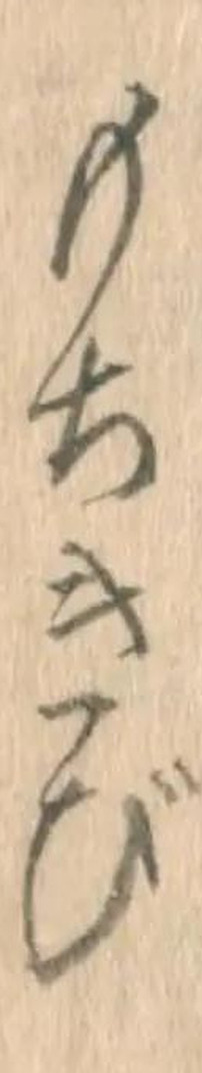もちきび

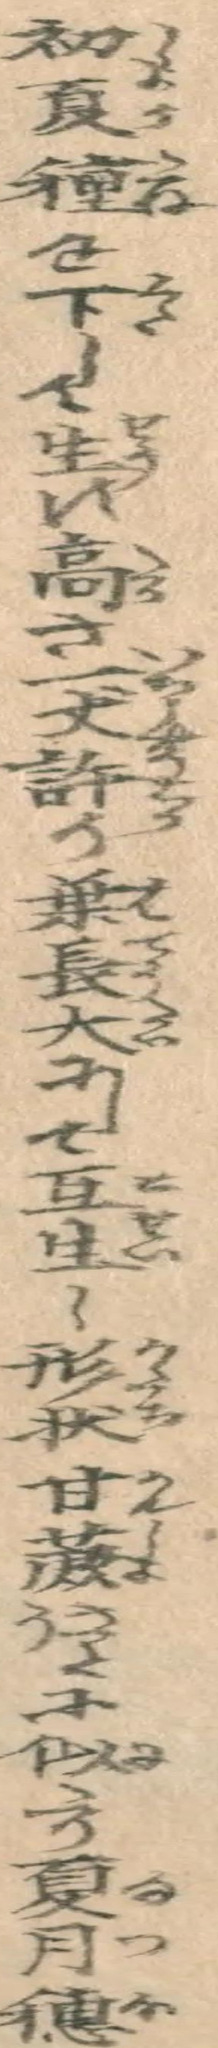初夏種を下して生す高さ一丈許り葉長大にして互生し形状甘蔗さとうに似たり夏月穂
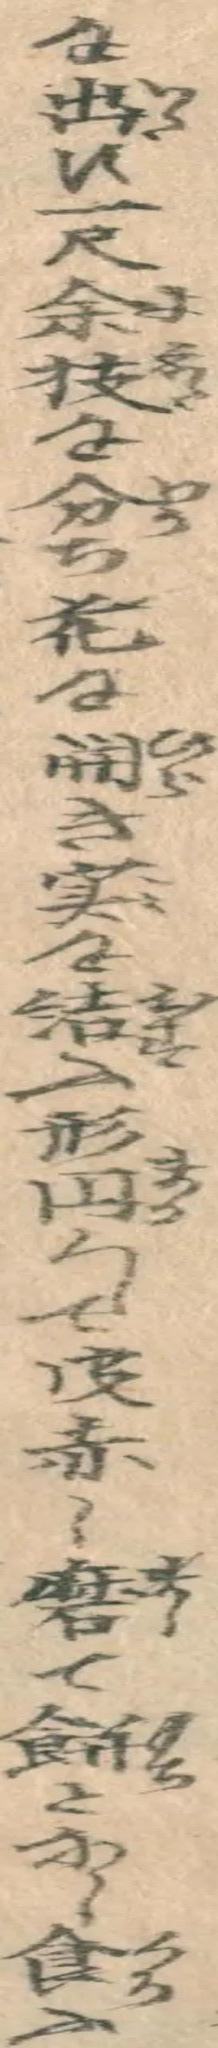を出す一尺余枝を分ち花を開き実を結ふ形円くして皮赤し磨て餅となし食ふ
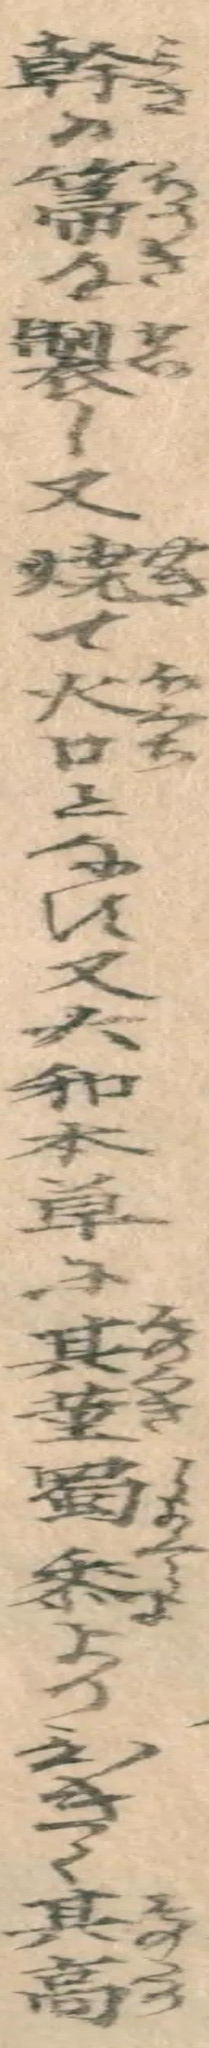幹は箒を製し又焼て火口となす又大和本草に其茎蜀黍よりひきく其高
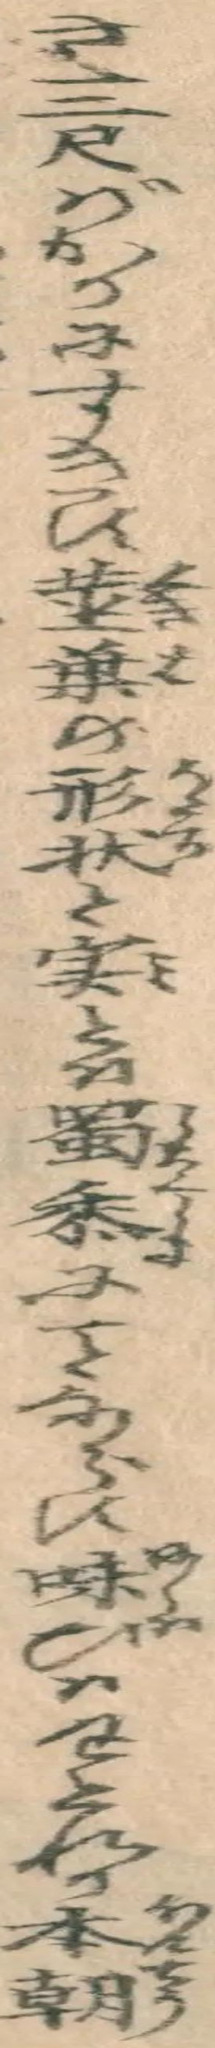さ一二尺ばかりにすきす茎葉の形状と実とは蜀黍にことならす味ひはをとれり本朝
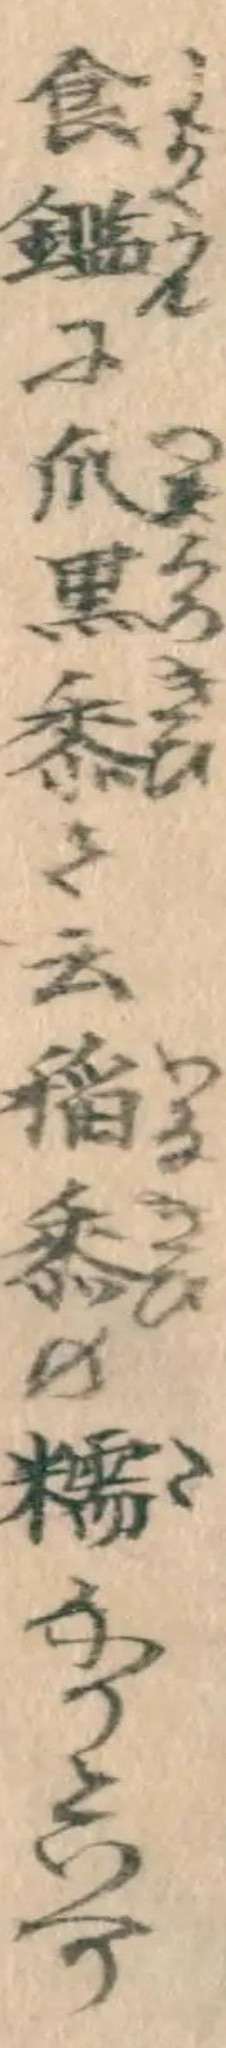食鑑に爪黒黍と云稲黍の糯なりといへり

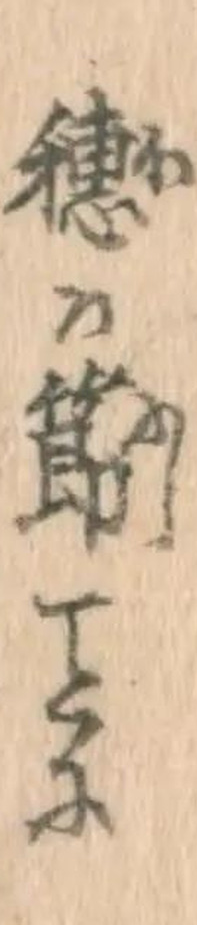穂は節ことに
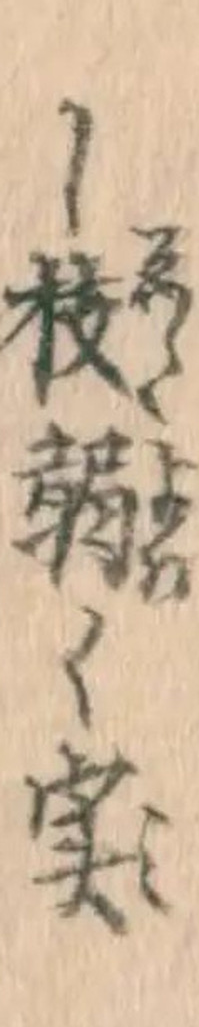し枝弱く実
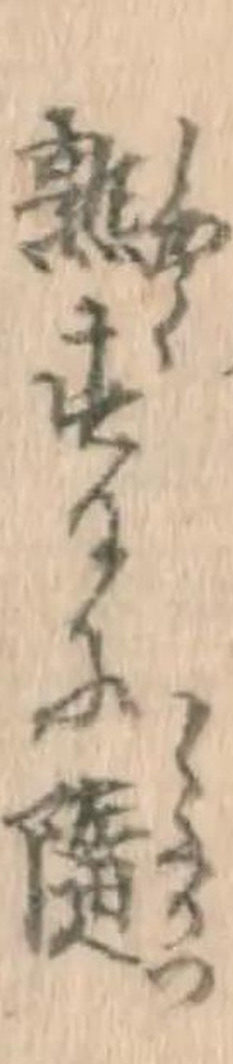熟するに随
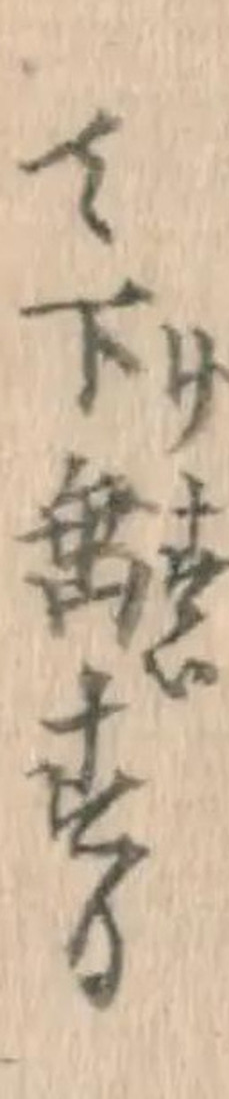て下垂する
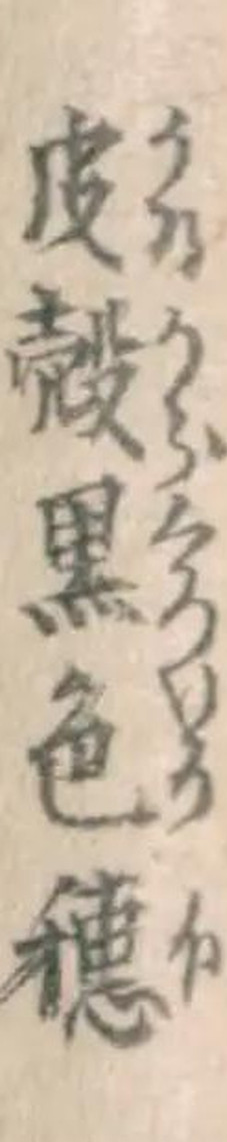皮殻黒色穂
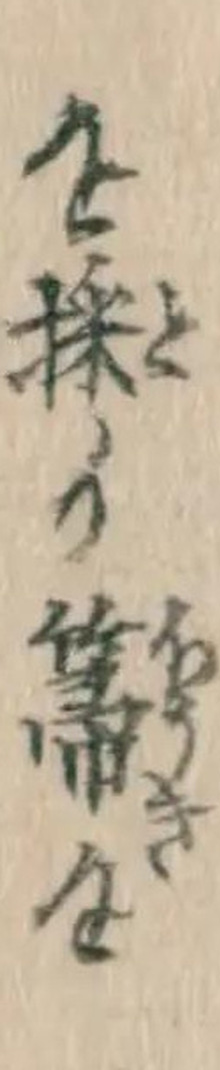を採り箒を

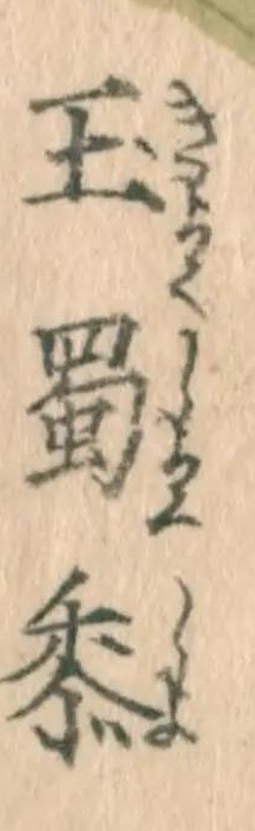玉蜀黍
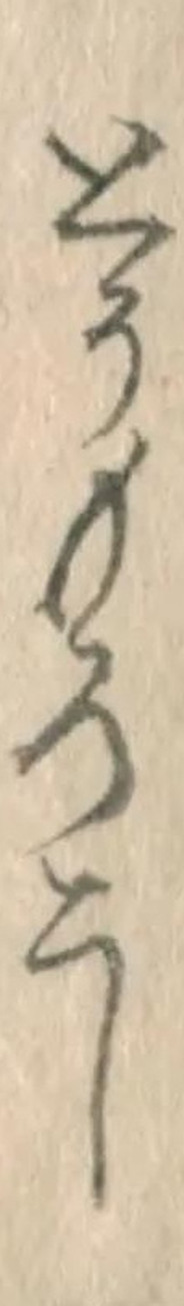とうもろこし
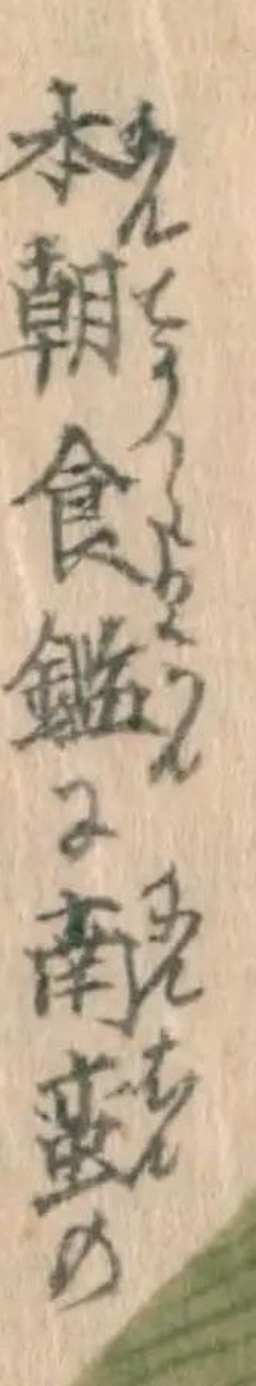本朝食鑑に南蛮の
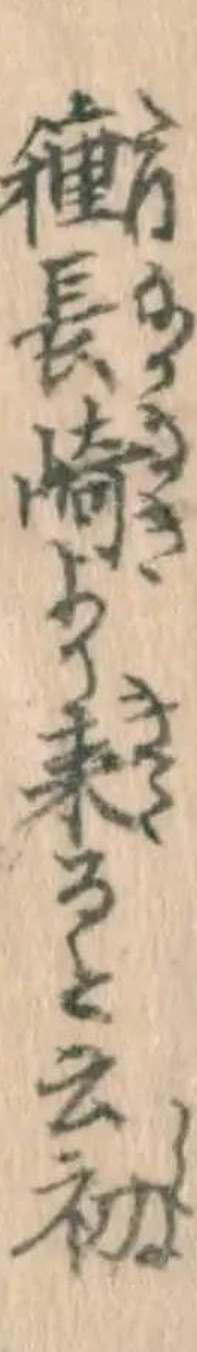種長崎より来ると云初
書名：本草図譜. 巻40-42
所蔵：国立国会図書館 National Diet Library, JAPAN
